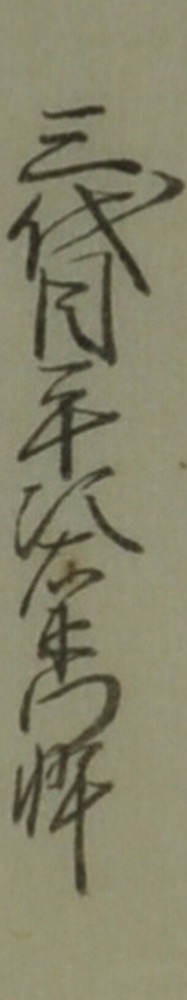三代目平次右衛門
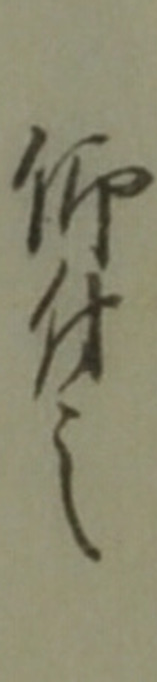仰付之
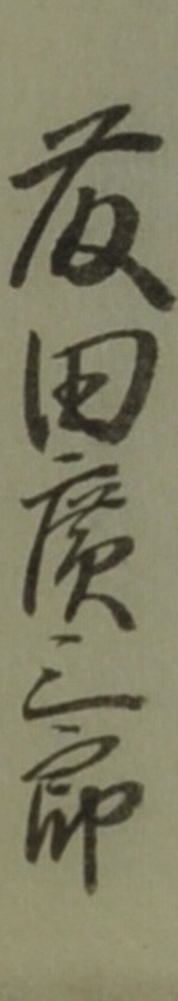藤田広三郎
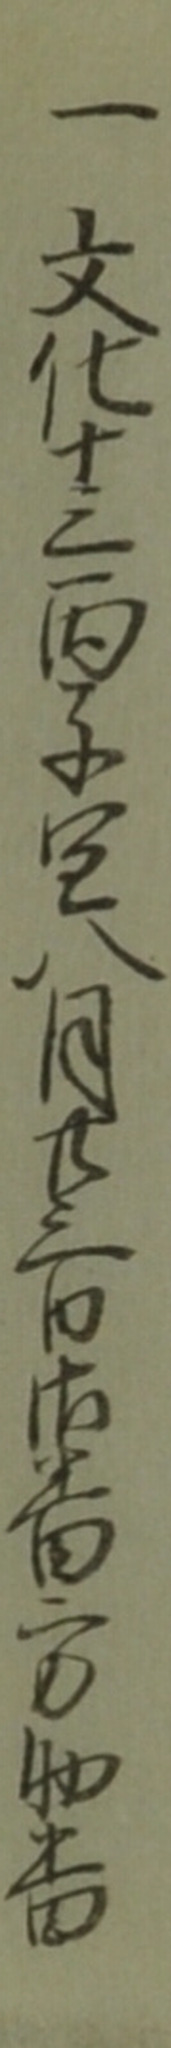一文化十三丙子閏八月廿三日御番方助番
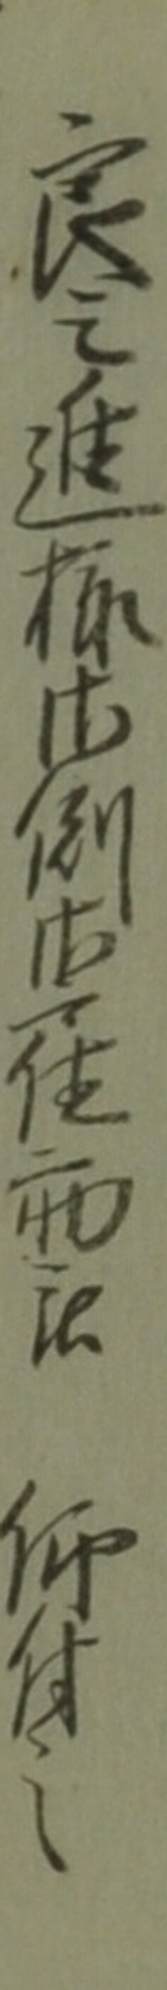良之進様御側御雇被仰付之
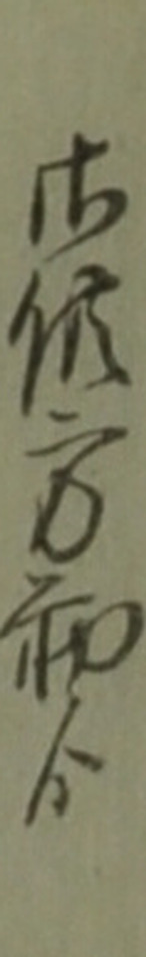御供方勤ゟ
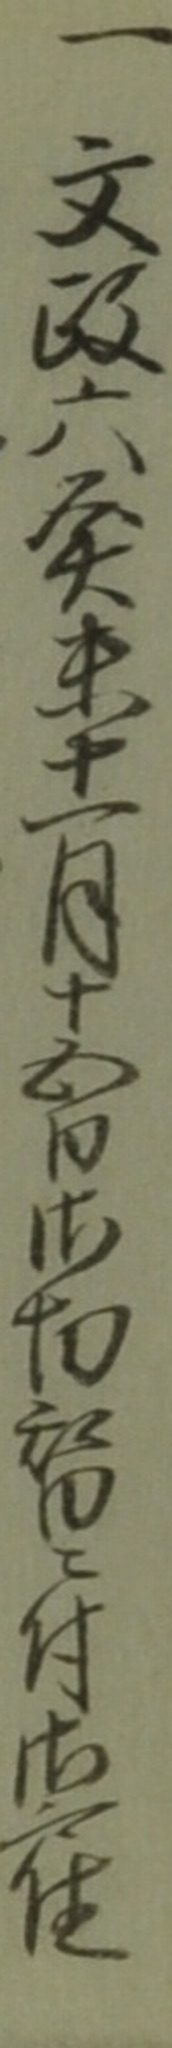一文政六癸未十一月十五日御切替ニ付御雇
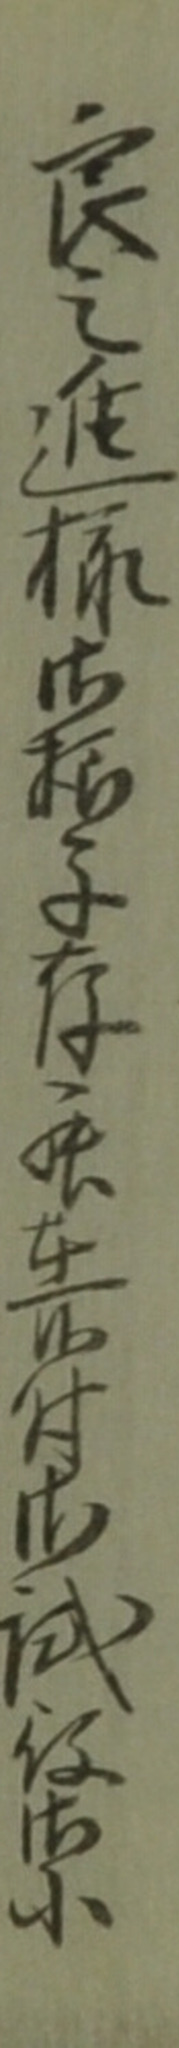良之進様御様子存罷在候付御試役御小
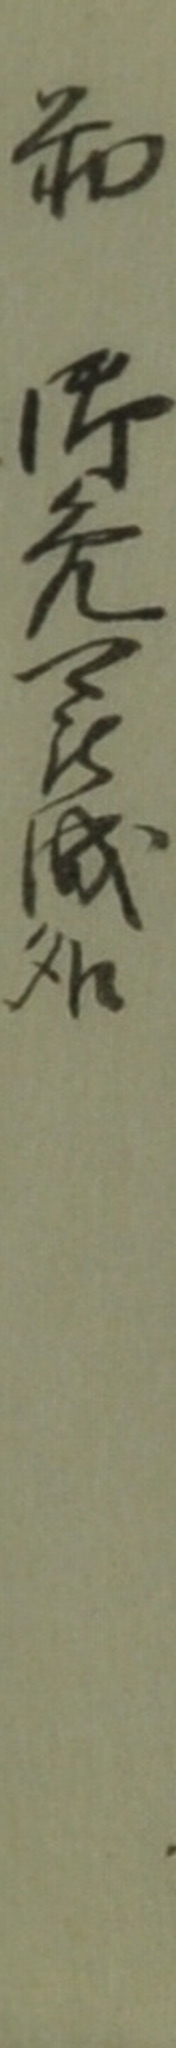勤御免可被成処
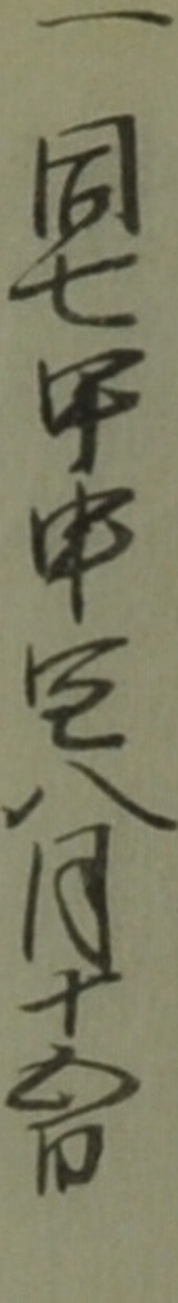一同七甲申閏八月十五日
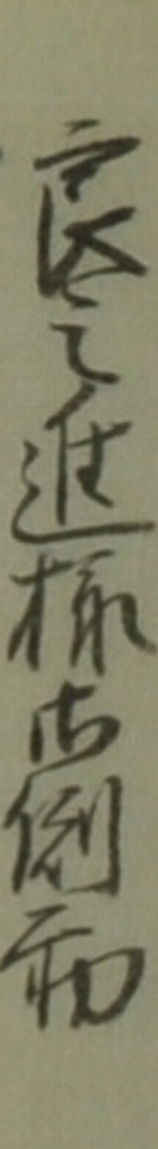良之進様御側勤
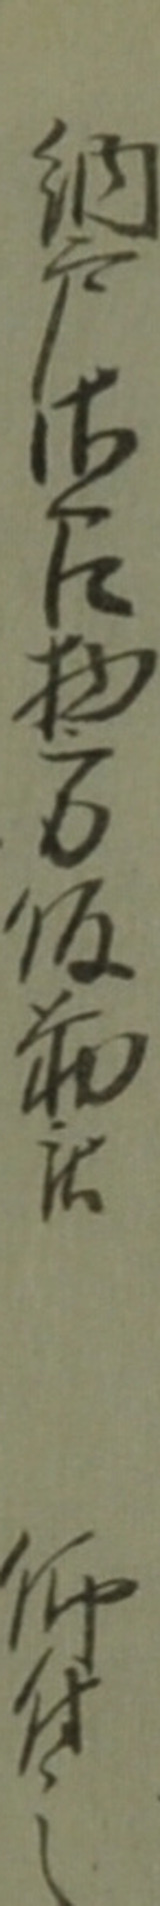納戸御召物方仮役被仰付之
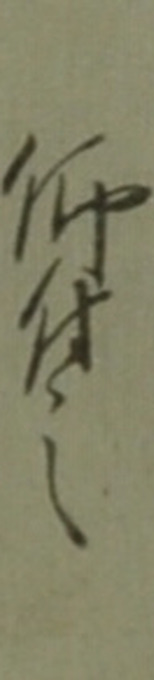仰付之
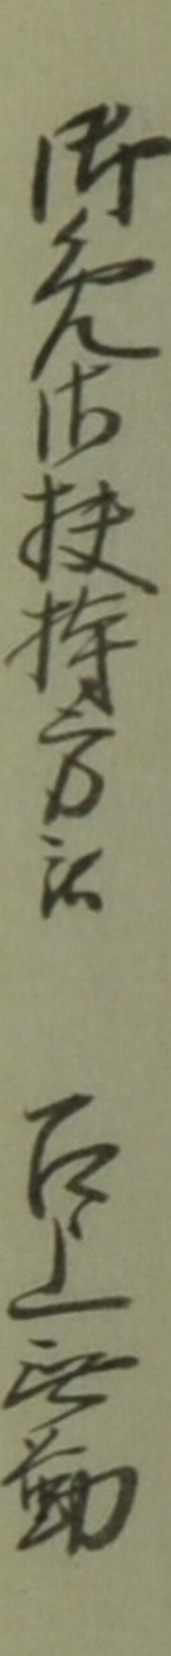御免御扶持方被召上無勤

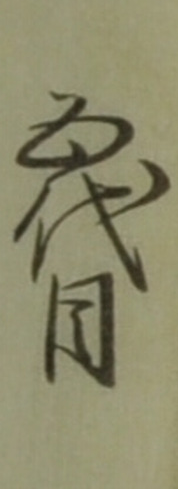五代目
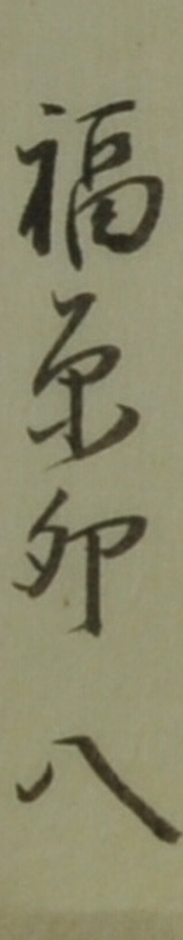福原卯八
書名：諸御役代々録（五）
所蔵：伊那市立高遠町図書館・合同会社AMANE
